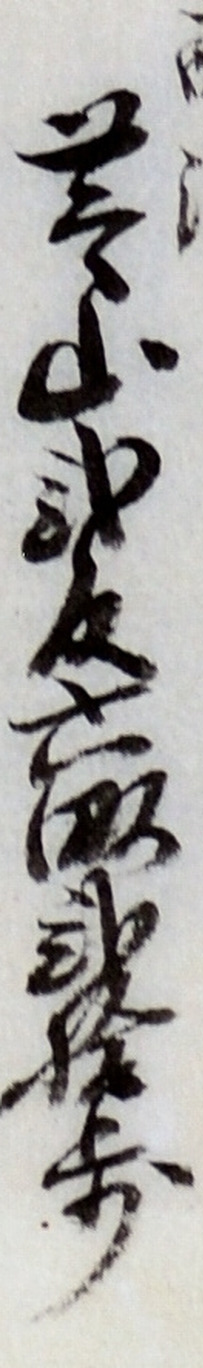芝山弐反六畝弐拾歩村中
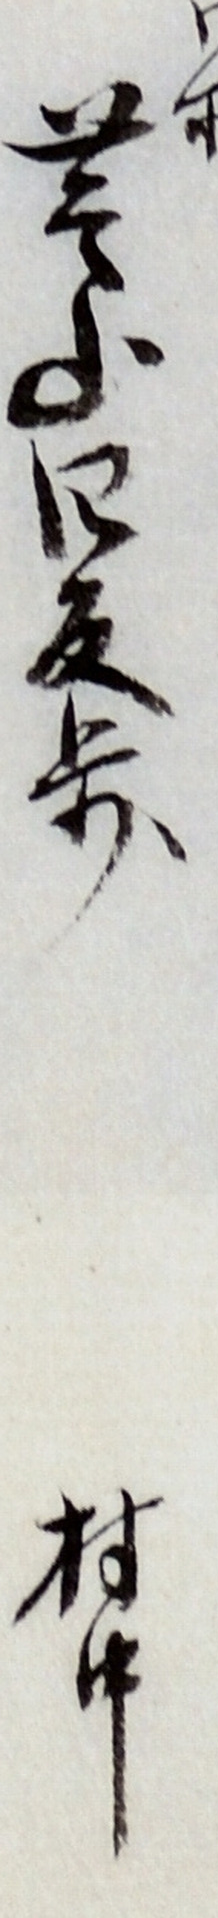芝山四反歩村中
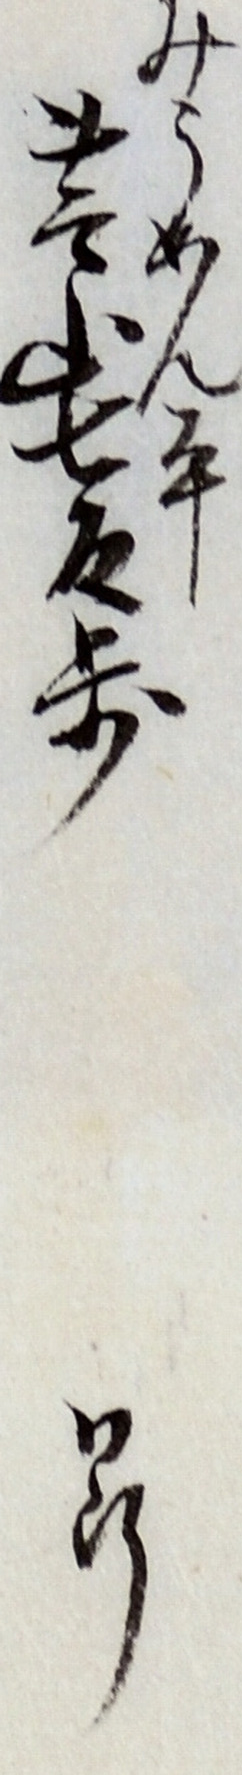芝山七反歩同断
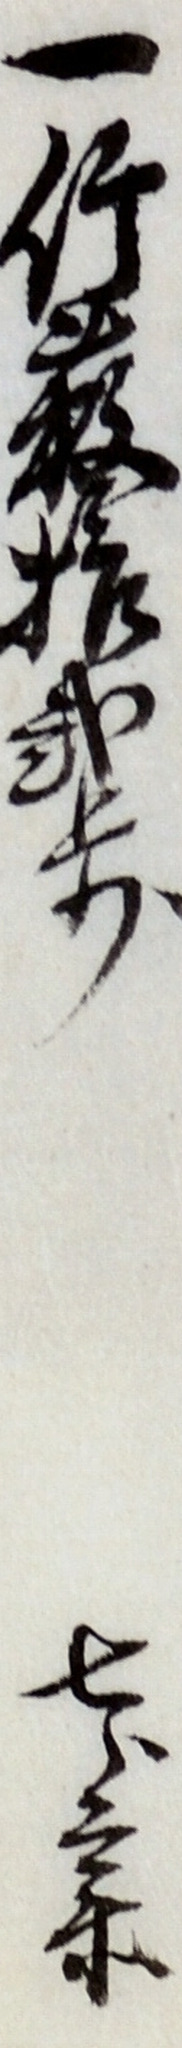一竹藪拾弐歩七郎兵衛
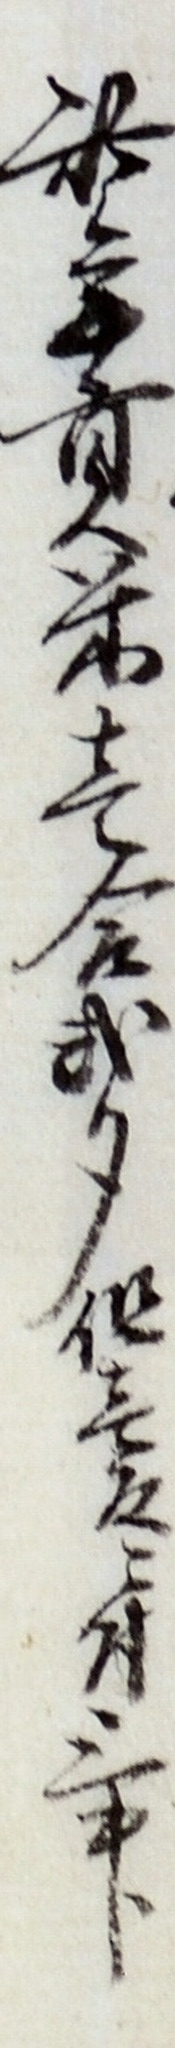此年貢米壱合弐勺但壱反ニ付三升
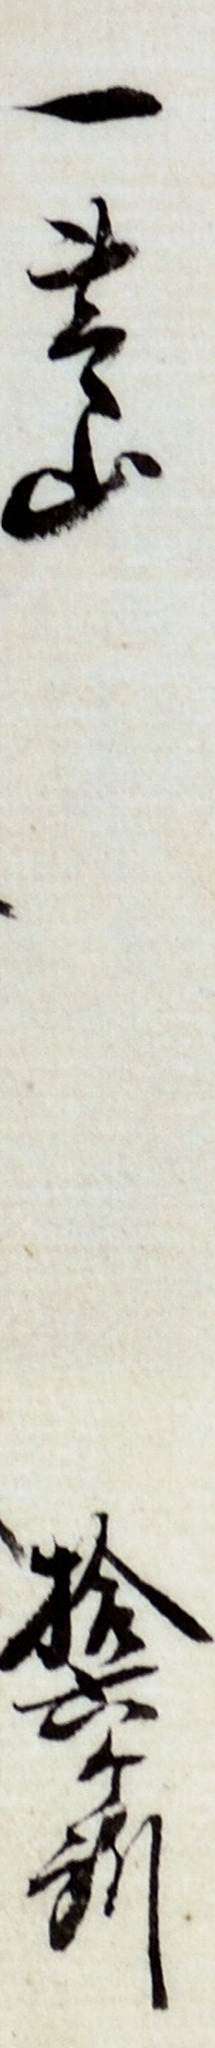一芝山拾六ヶ所
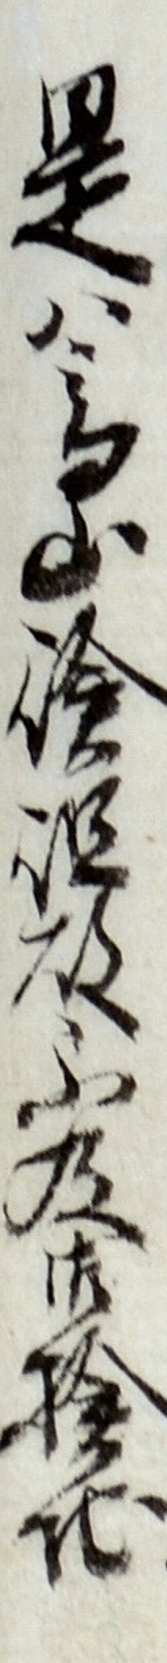是ハ高山嶮岨故不及御検地
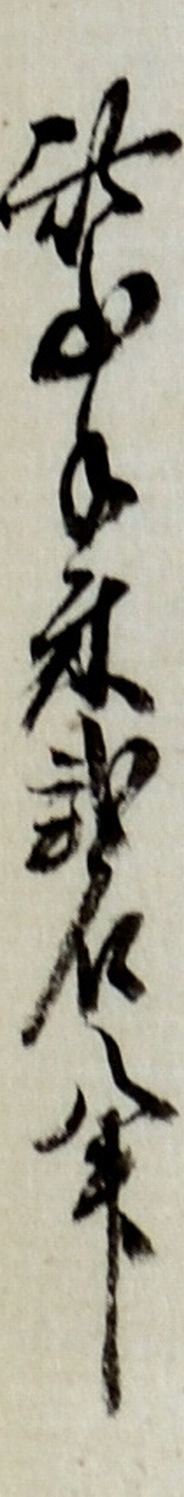此山手米弐石八升
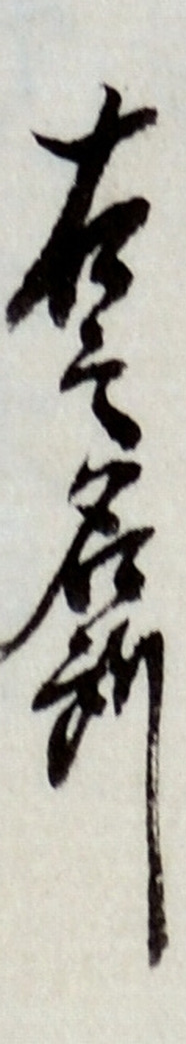右之名所

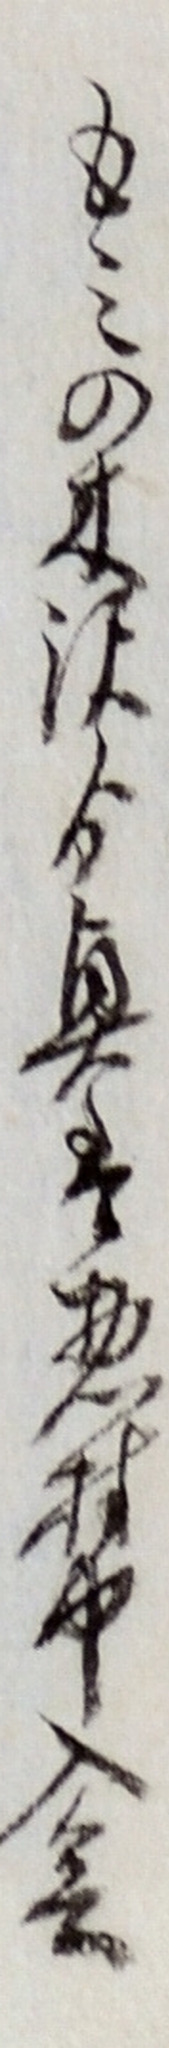もみの木沢より奥は惣村中入会
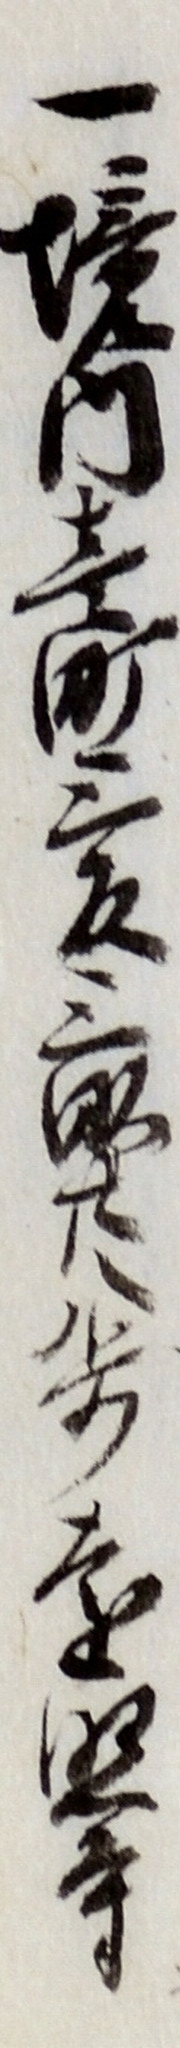一境内壱町参反三畝廿歩遠照寺
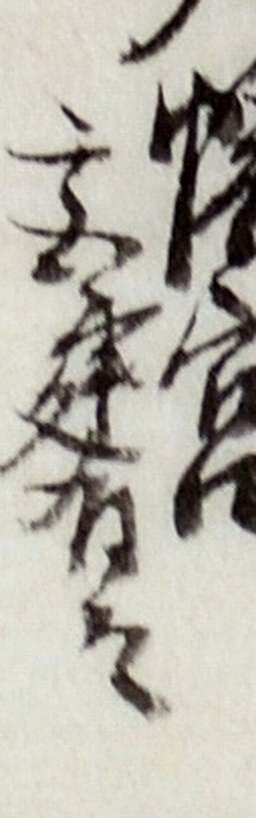宮建有之
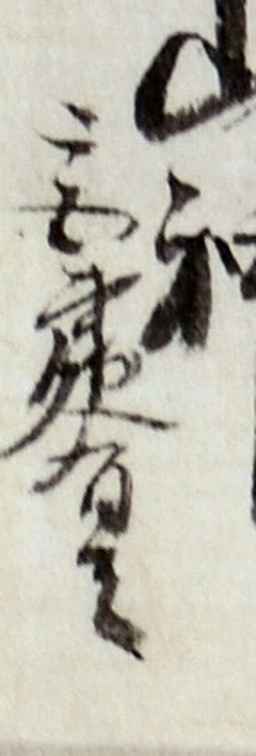宮建有之
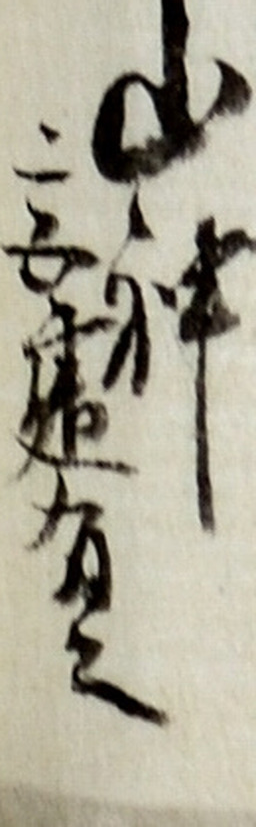宮建有之
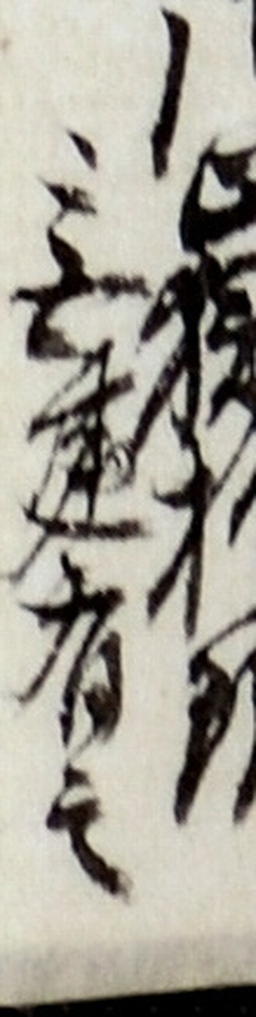宮建有之
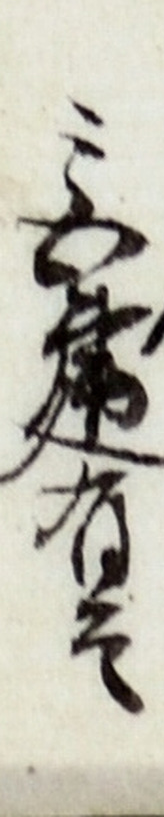宮建有之
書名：御領分中山林社地手控
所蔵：伊那市立高遠町図書館・合同会社AMANE
